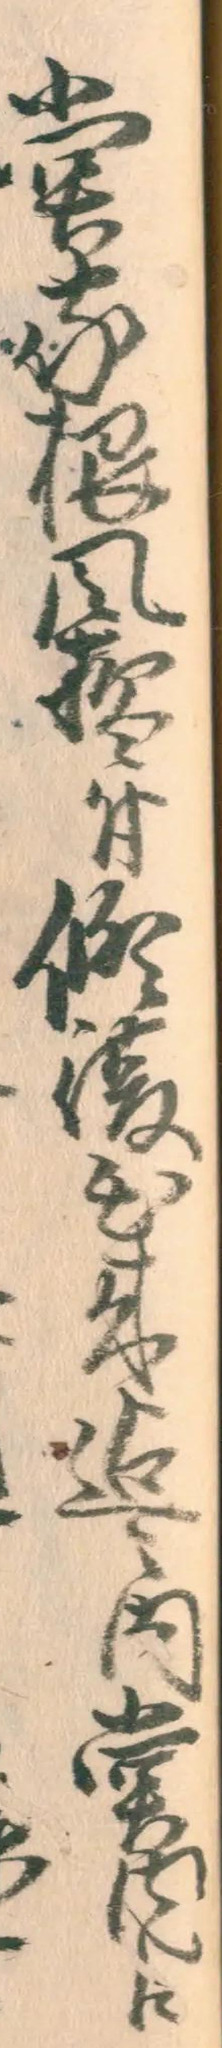一堂家根風損ニ付修復出来迄之内堂内え
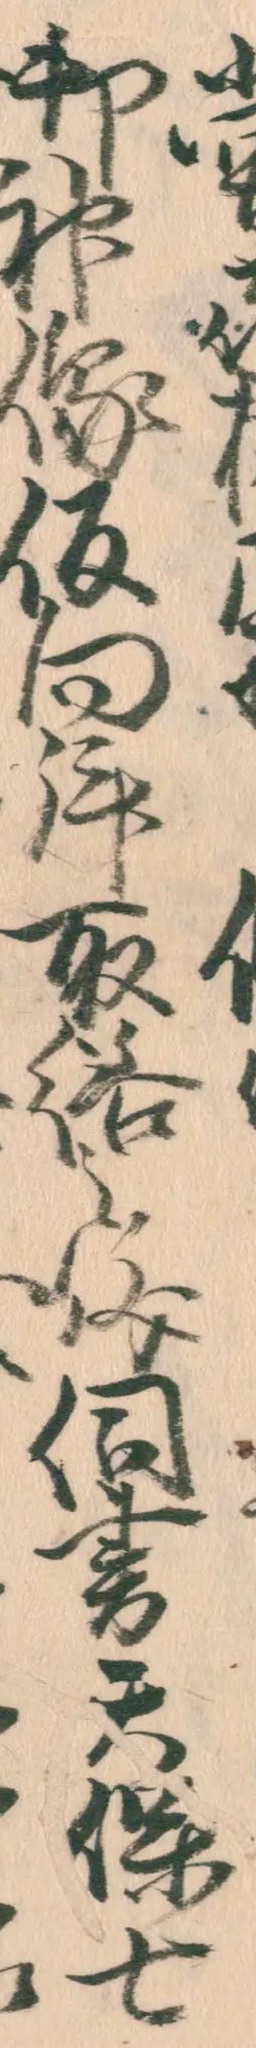御神像仮向拝取繕之儀伺書天保七
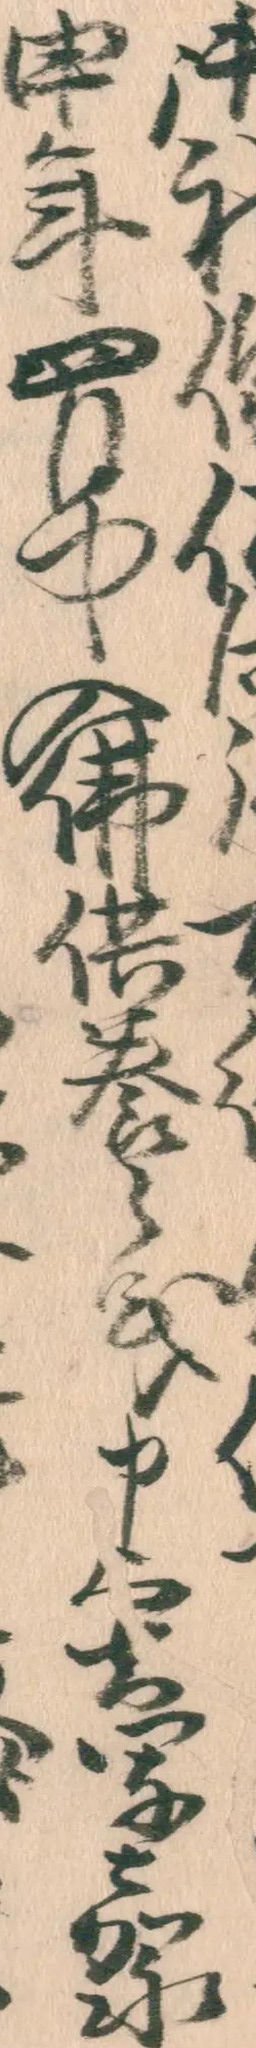申年四月申中入仏供養之義申上書写嘉永
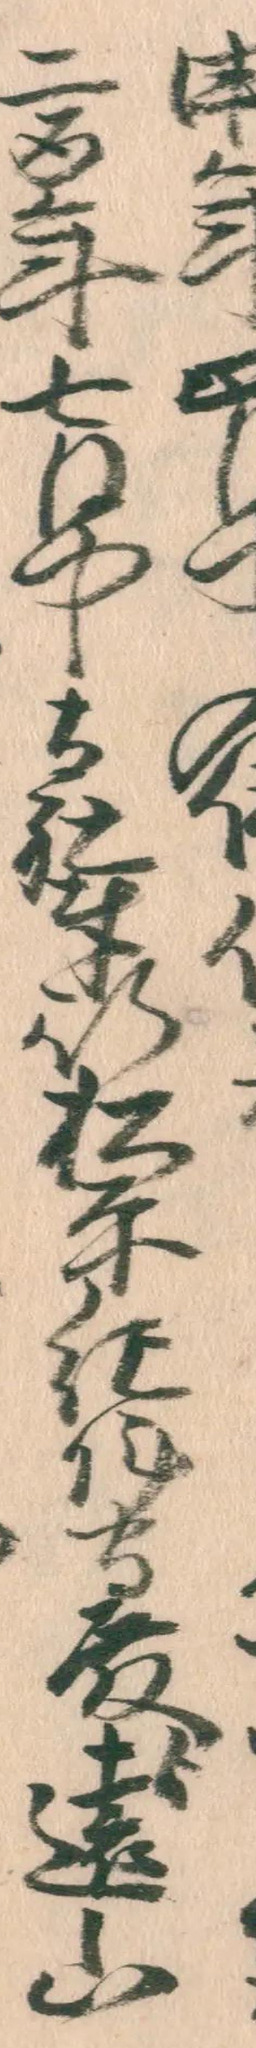二酉年七月中寺社奉行松平肥後守殿ゟ遠山
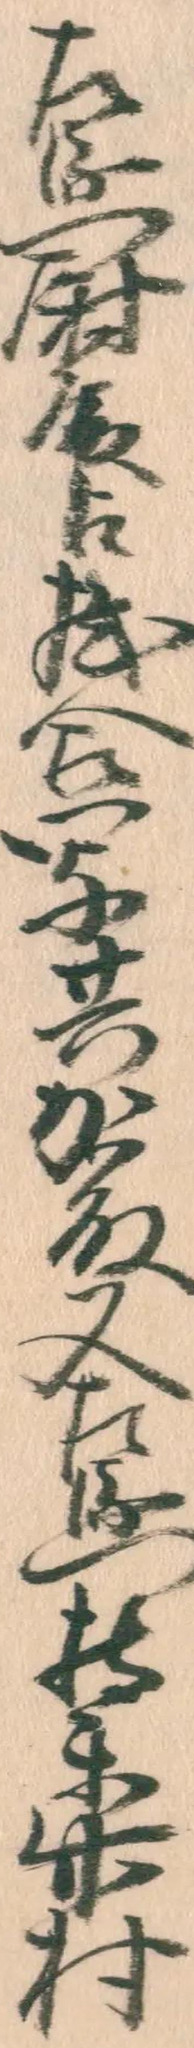左衛門尉殿え掛合写共加藤又左衛門持参竹村
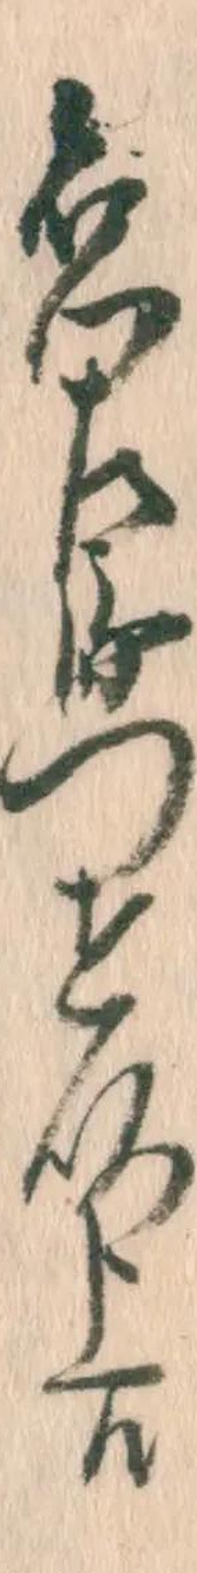慈左衛門を以上ル
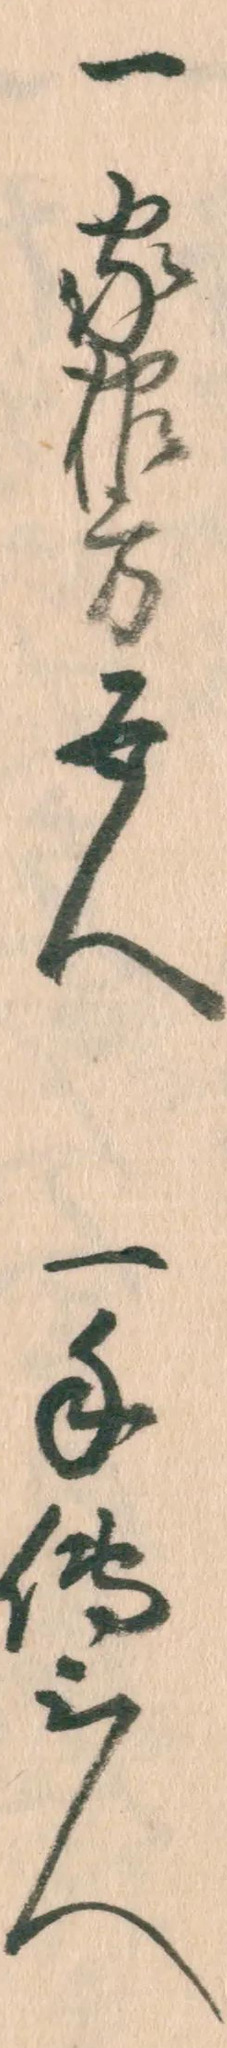一家根方五人一手伝三人
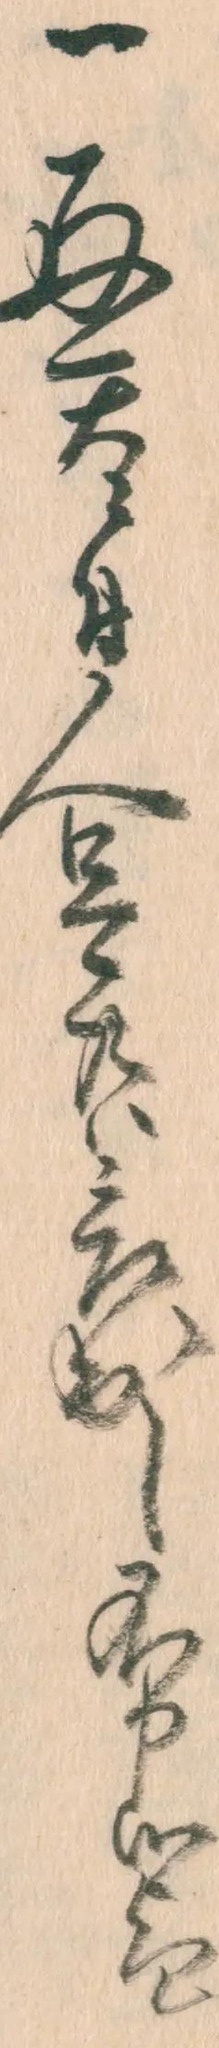一雨天ニ付人足共ハ差出し不申候旨
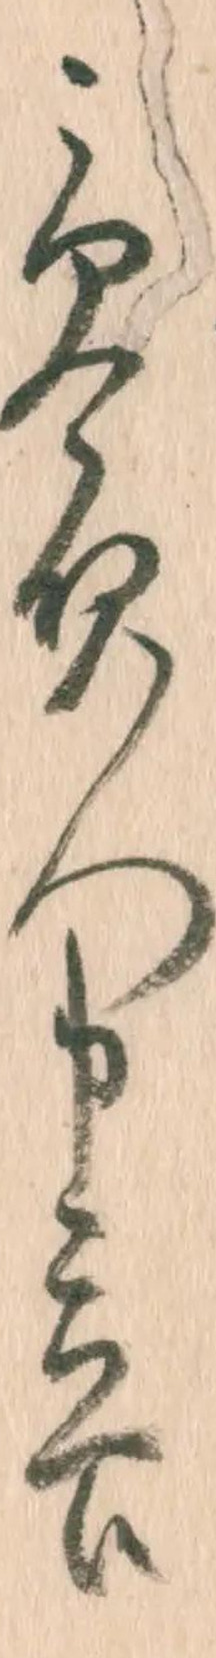請負人申立候

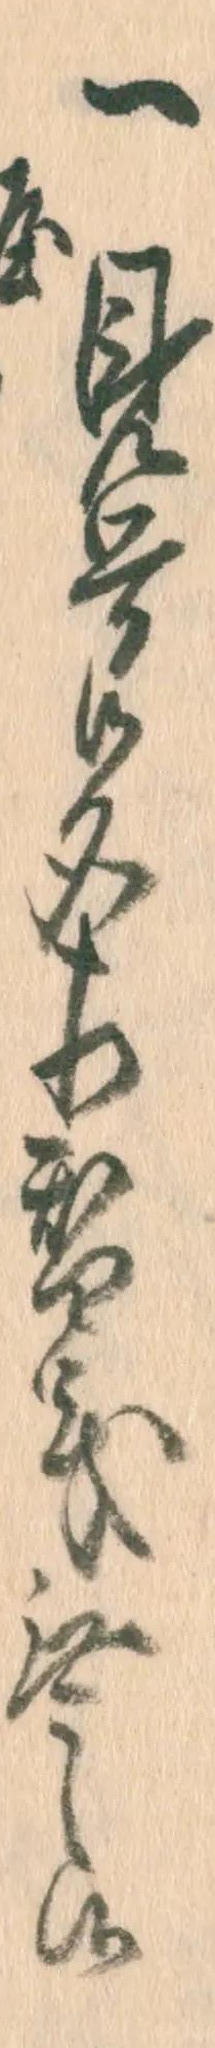一見廻り候処相替義無之候
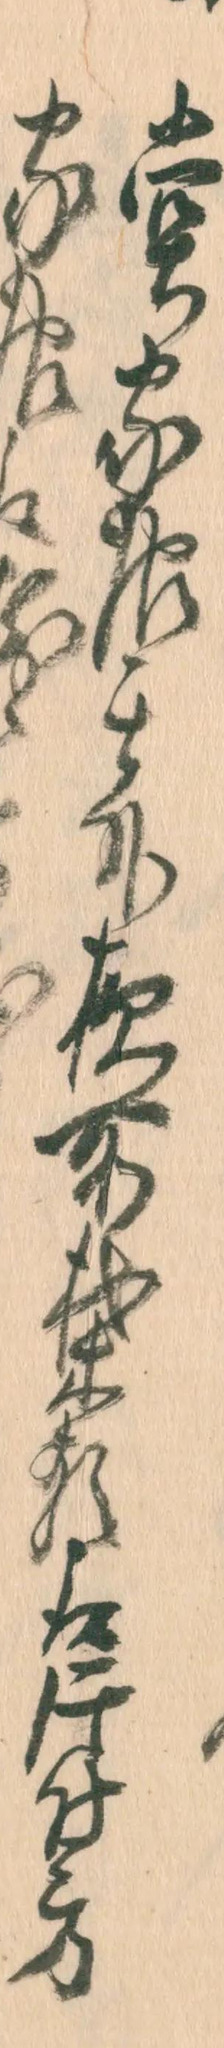一堂家根其外損所材木類取片付方
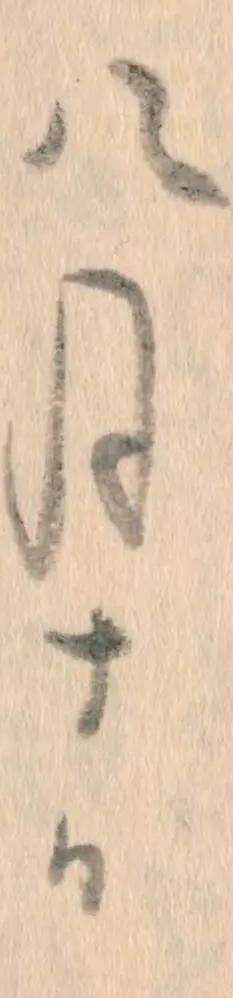八月十日
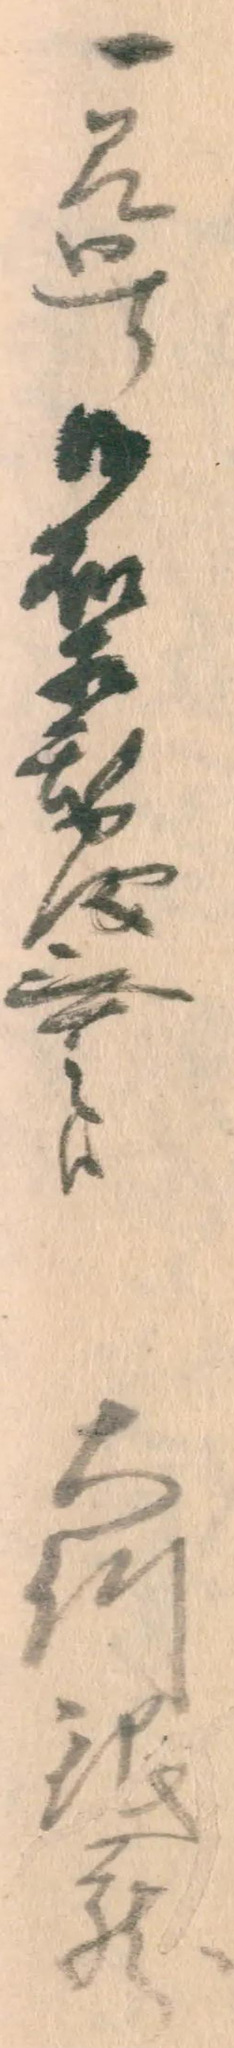一見廻り候処相替義無之候大竹銀蔵
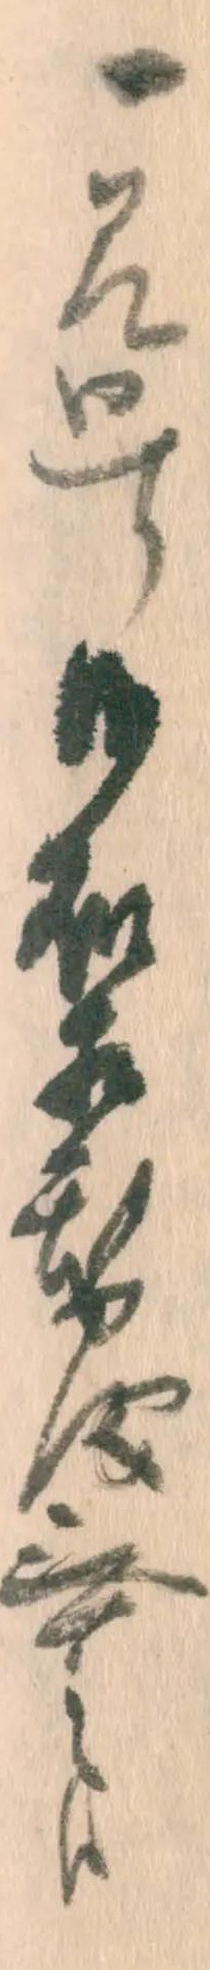一見廻り候処相替義無之候
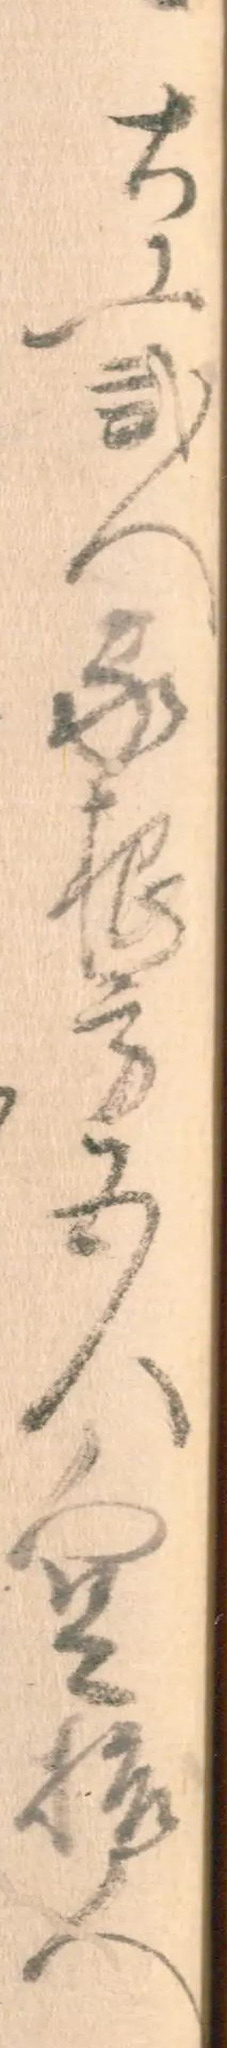一大工弐人家根方五人人足拾人
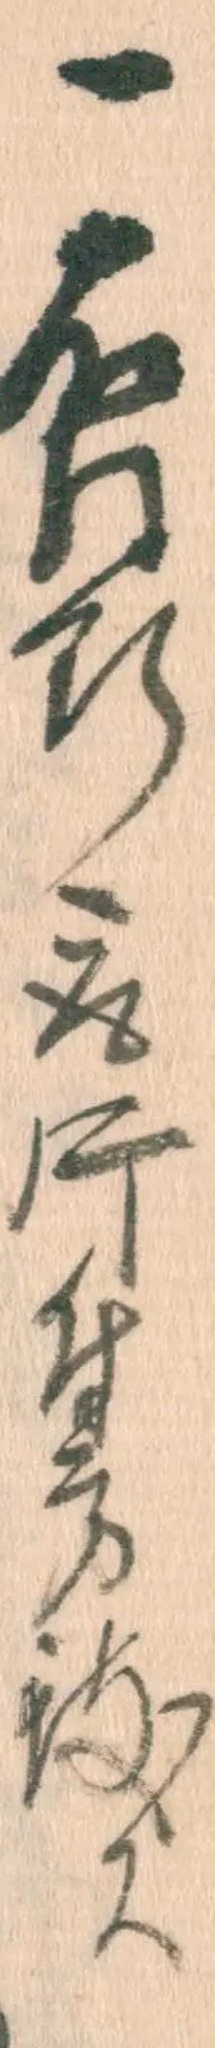一右同断取片付方致ス
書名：三十三間堂. [2]
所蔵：国立国会図書館 National Diet Library, JAPAN
